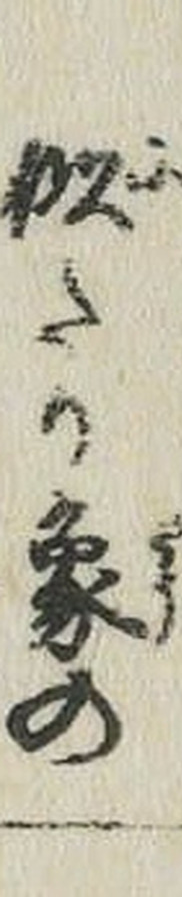似たり象の
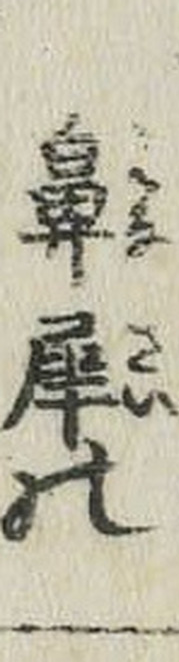鼻犀の
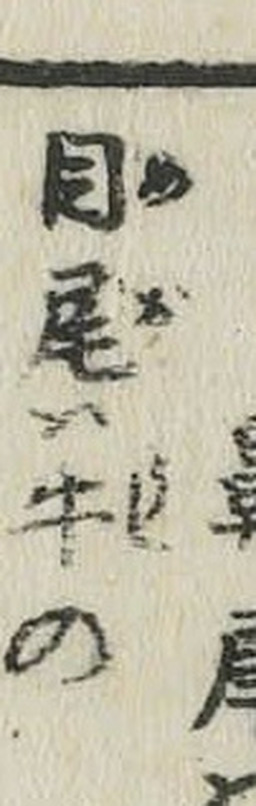目尾は牛の
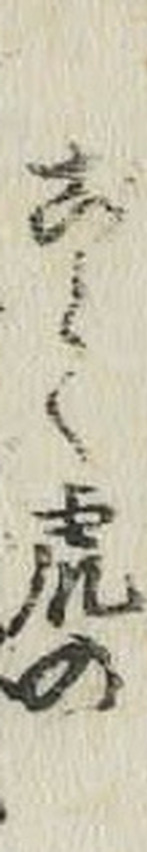ごとく虎の
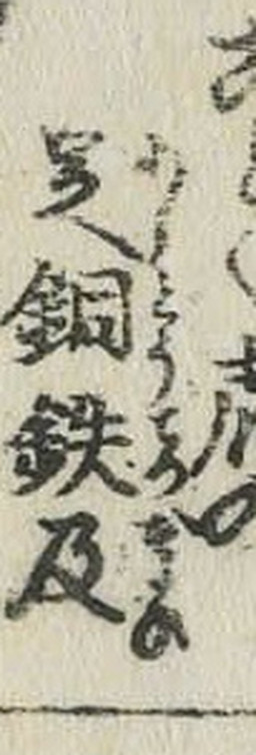足銅鉄及
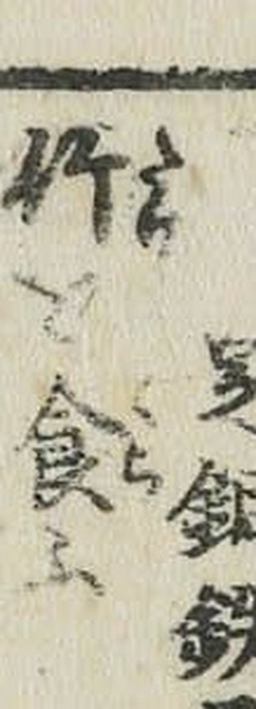竹を食ふ
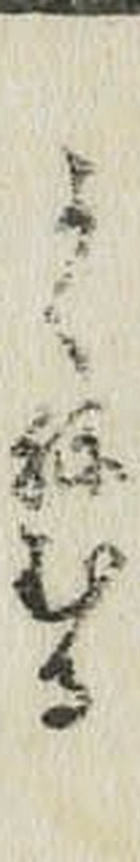よくねむる
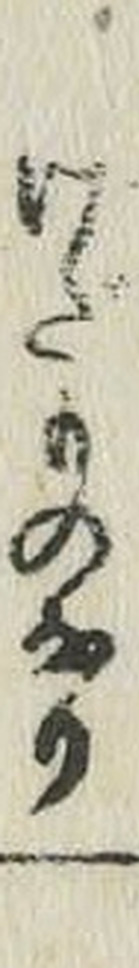けだものなり
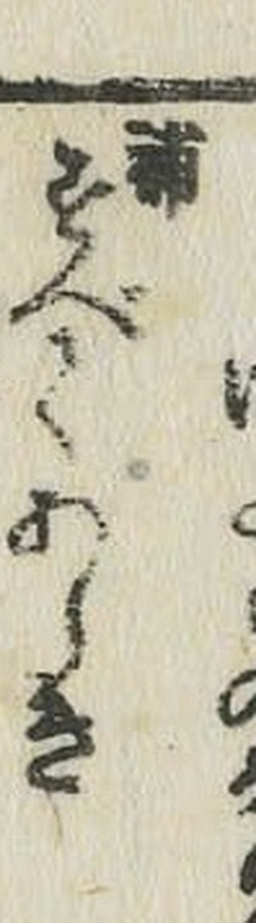補すべてあしき
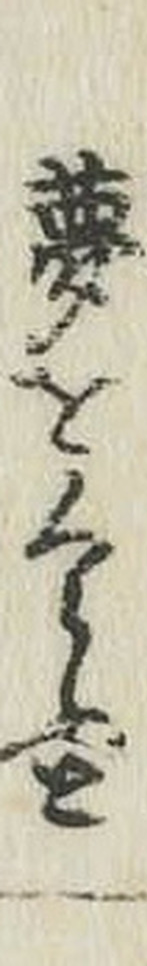夢をくらふと
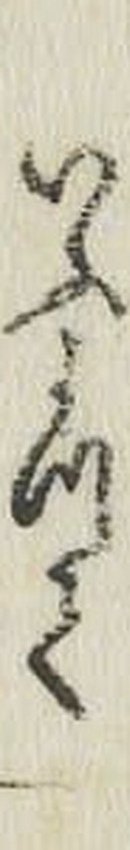いふよつて
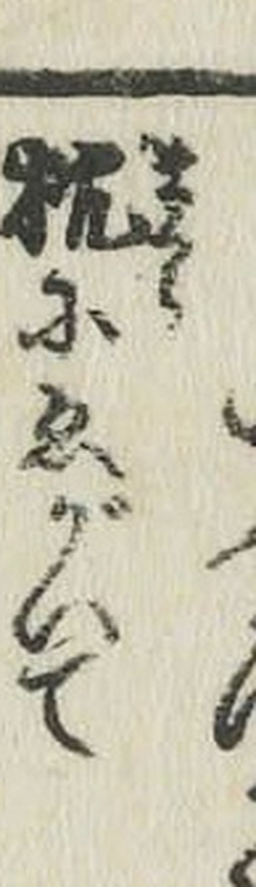枕にゑがいて
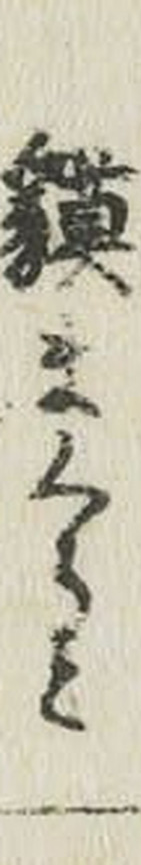貘まくらと
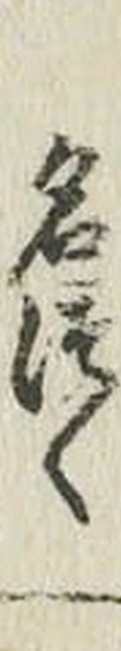名づく
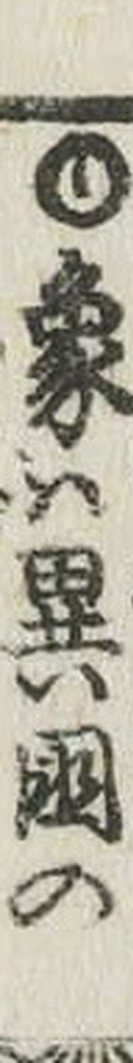○象は異国の
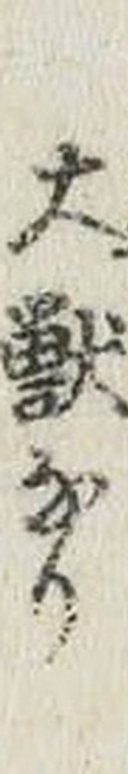大獣なり
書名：増補頭書訓蒙図彙大成 10巻 6:巻之12-13
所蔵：東京学芸大学教育コンテンツアーカイブ
